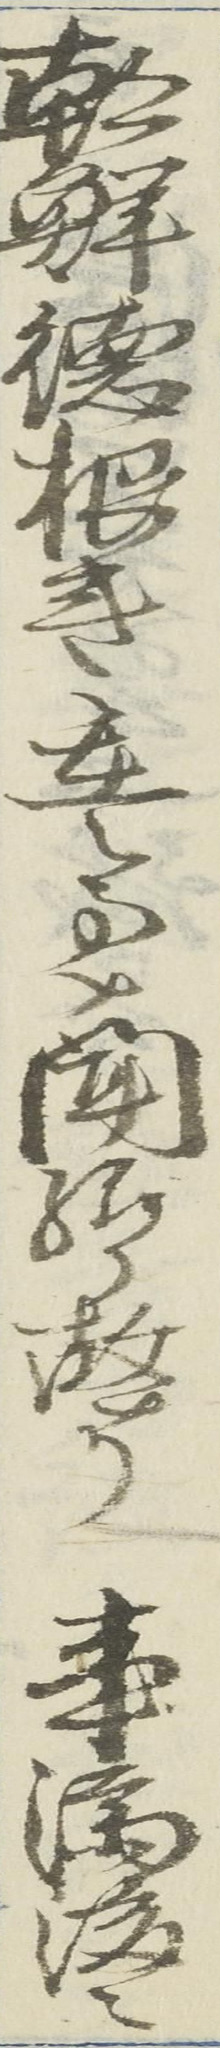朝鮮徳根在之事ヲ聞給う故ナリ事済後ニ
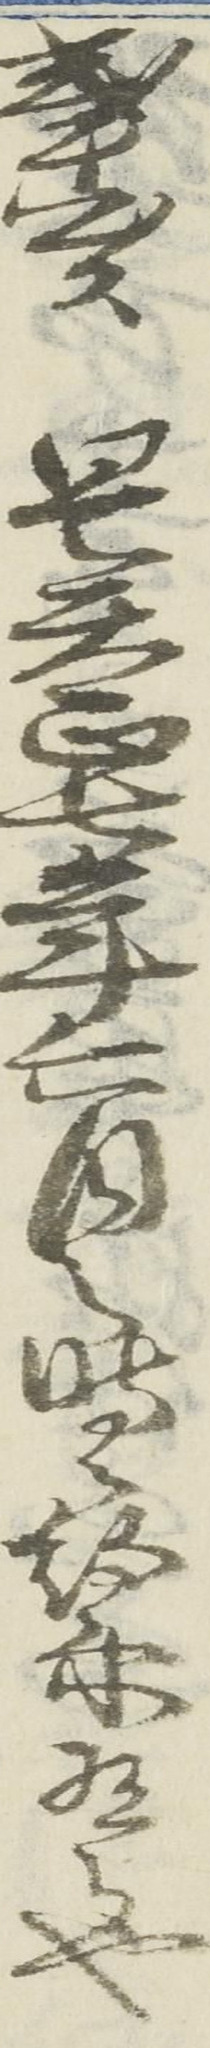奉公ス是天正七年六月之時ニ約束有ル也
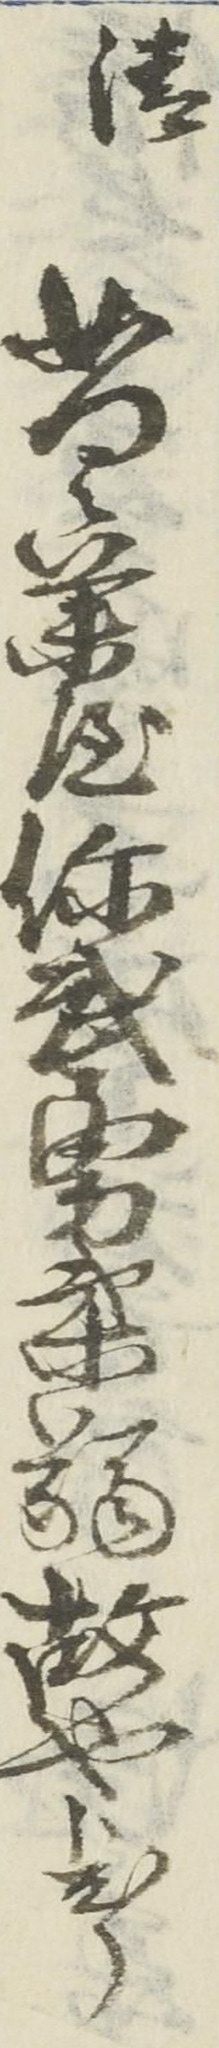清如何ニ薬屋你武勇柔弱故也ト云う
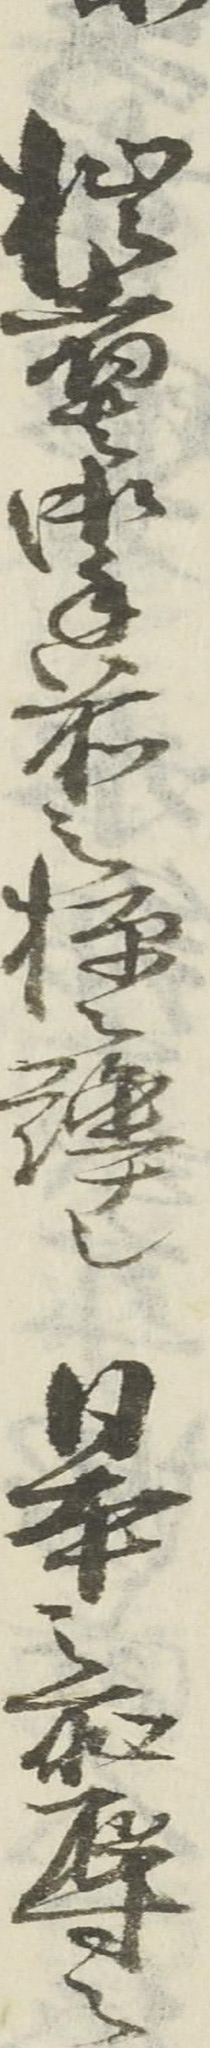小拙者は御手前之様ニ強ナシ日本之恥辱之
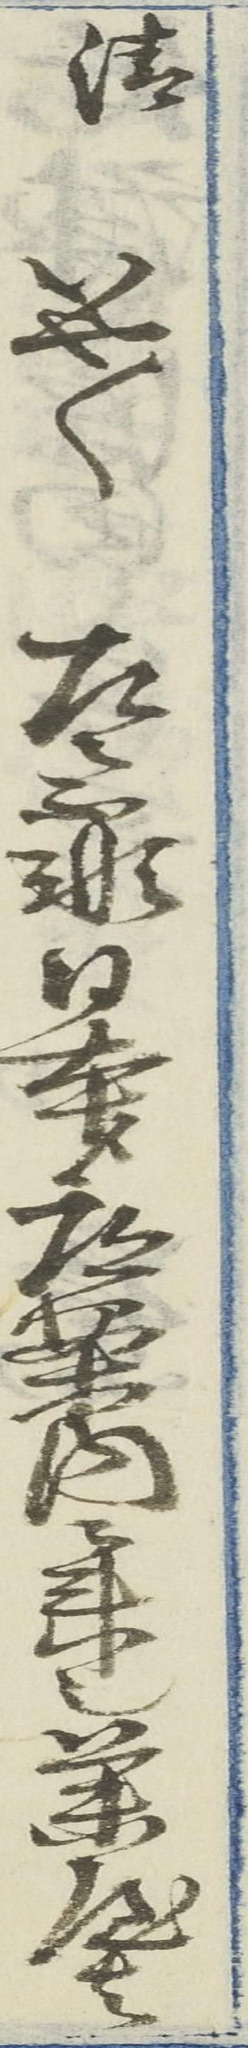清いやいや左ニ不非日本ゟ道案内ニ来シ薬屋は
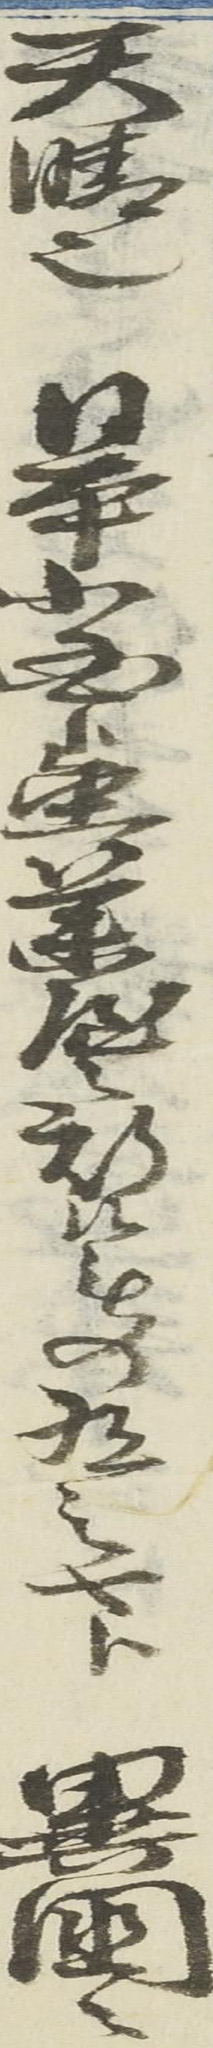天晴也日本小国ト雖薬屋ニ斯ルもの有之ヤト異国ニ
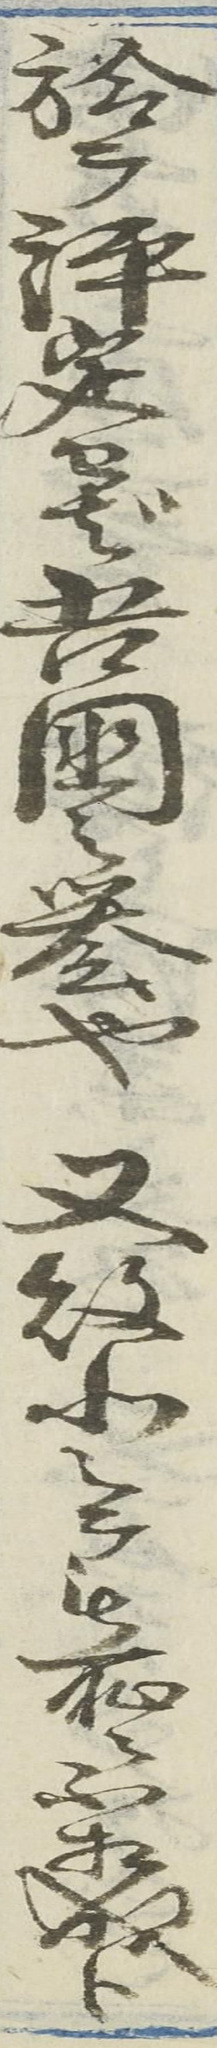於テ評定セバ吾国之誉也又役小シテも所〻不相成ト
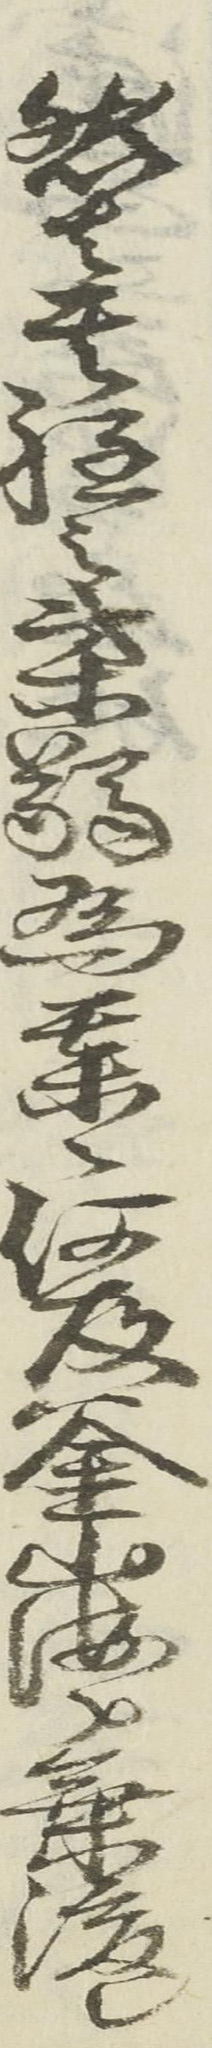小然は其程ニ柔弱為某ニ何故釜山海を乗渡し
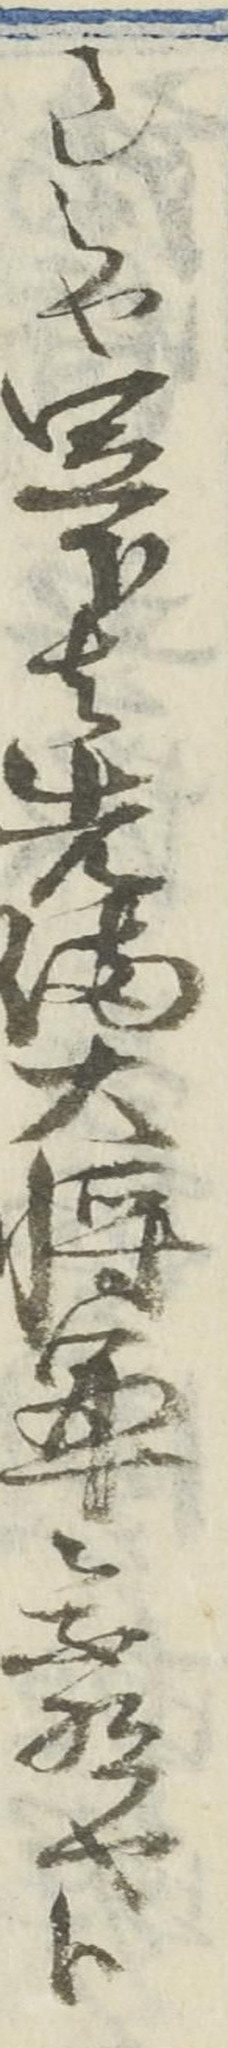しらや足下は先備大将軍ニ不有ヤト
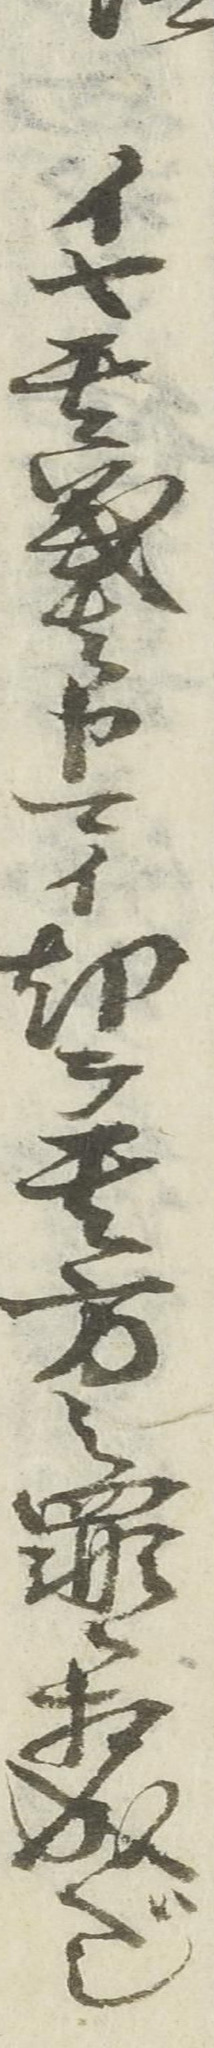清イヤ其義は申マイ却テ其方之罪ニ相成ベシ
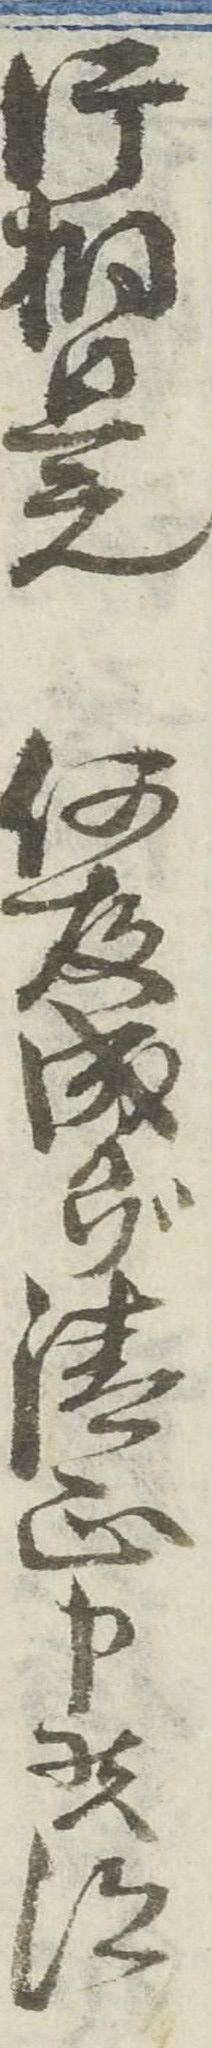片桐且元何故成ルゾ清正申候跡
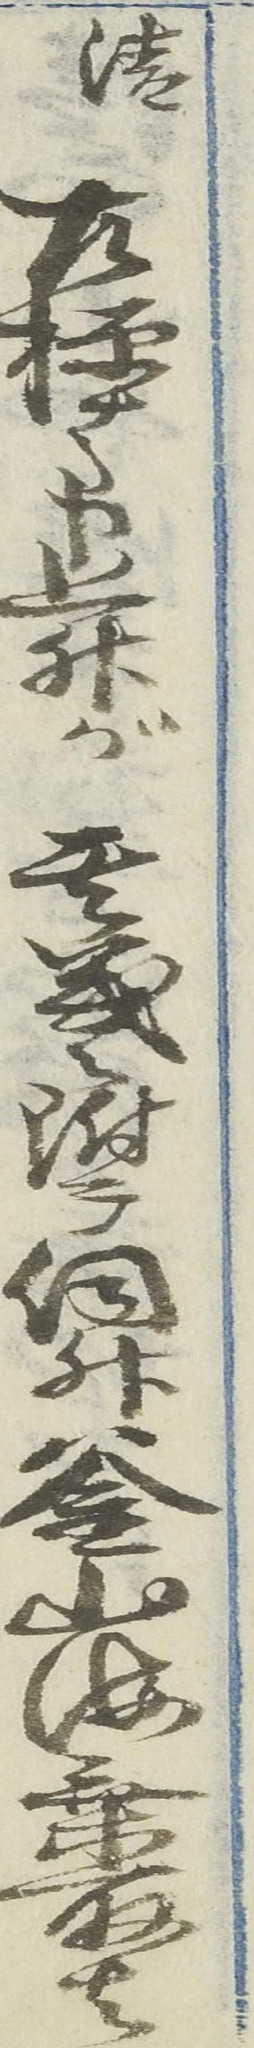清左様ナら申上升ガ其義ニ附テ伺升釜山海乗取は
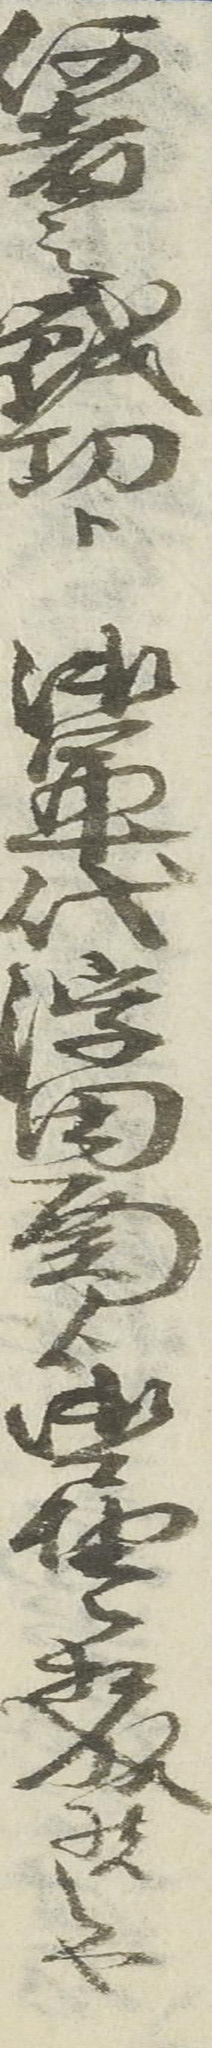何者之戦功ト御軍代浮田殿ゟ御届ニ相成候しや
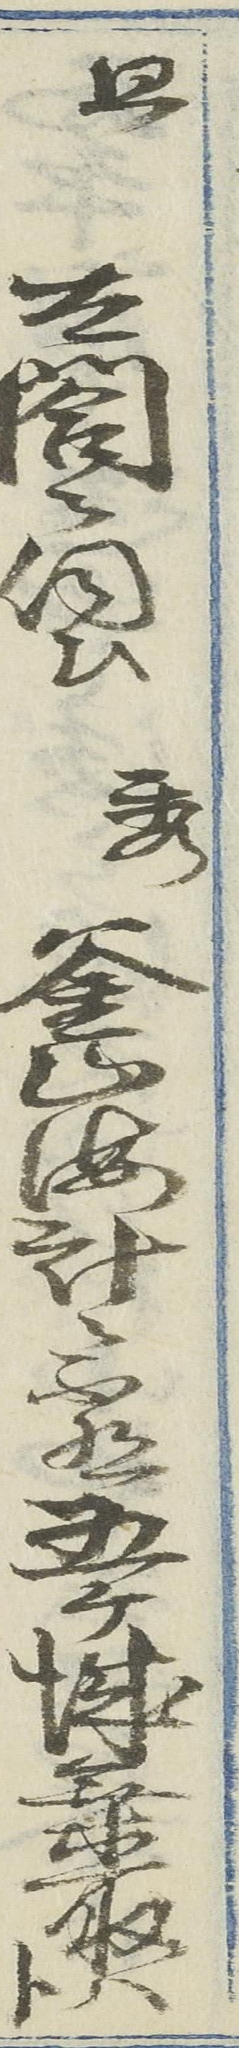且太閤ニ伺ひ秀釜山海計ニ不有五ケ城乗取ハト
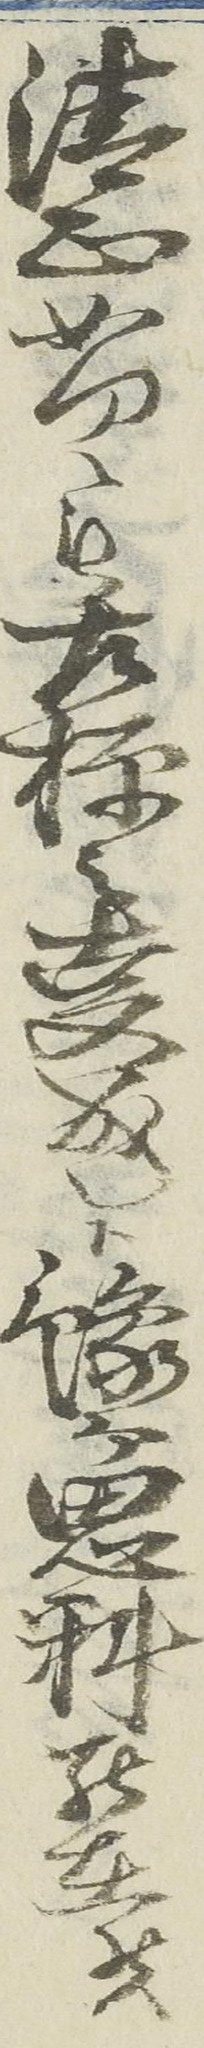清正如何ニも左様之事成しト豫而思料罷在候
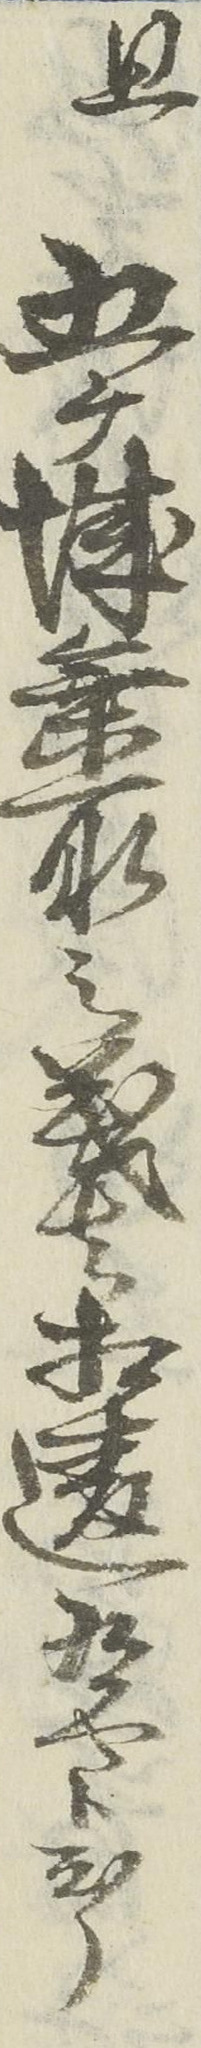且五ケ城乗取之義は相違有ヤト云う
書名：伏水大地震
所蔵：東京大学地震研究所図書室 Earthquake Research Institute Library, The University of Tokyo, JAPAN
